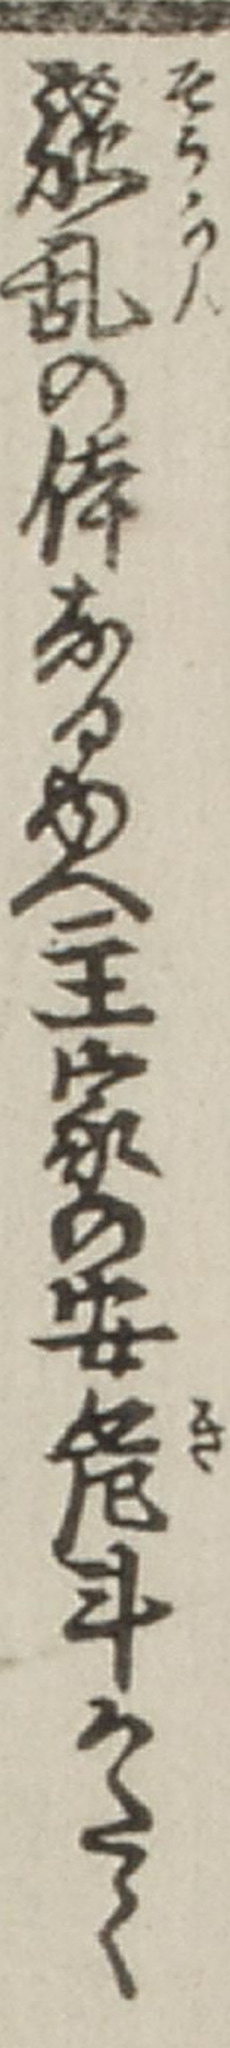騒乱の体なるゆへ主家の安危計かたく
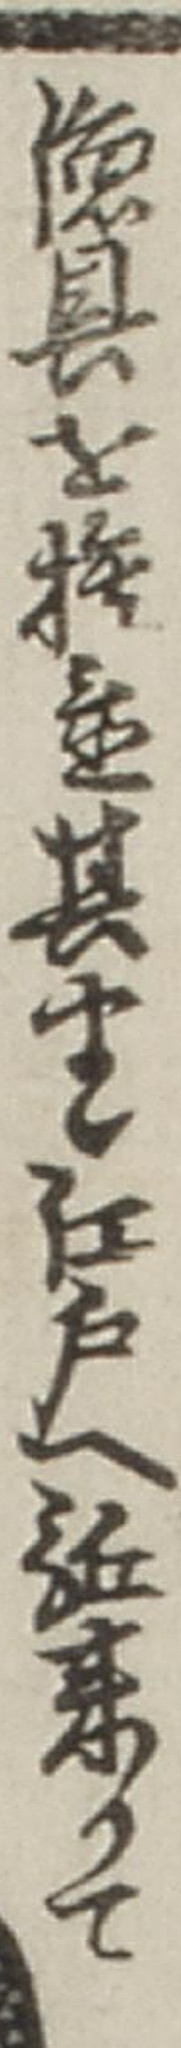漁具を捨置其まゝ江戸へ駈来りて
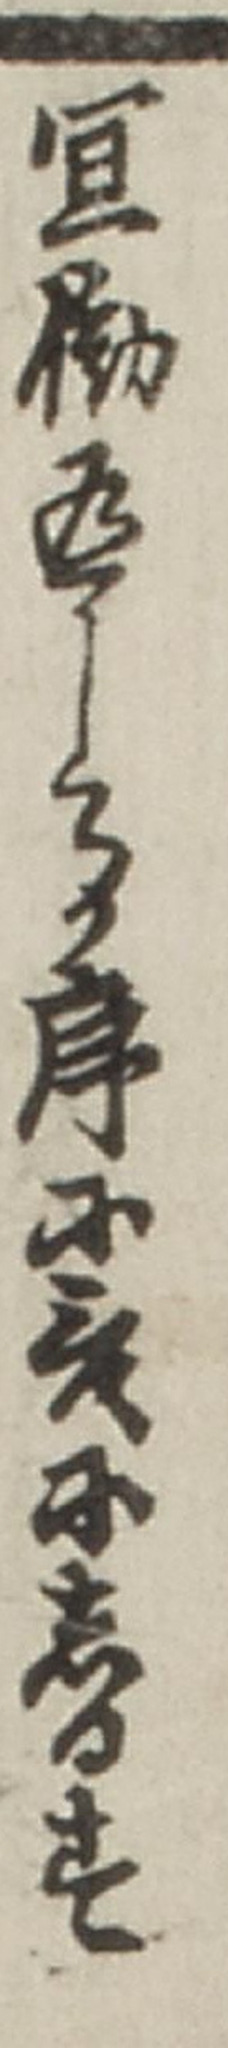宜働有し事序に爰にしるす

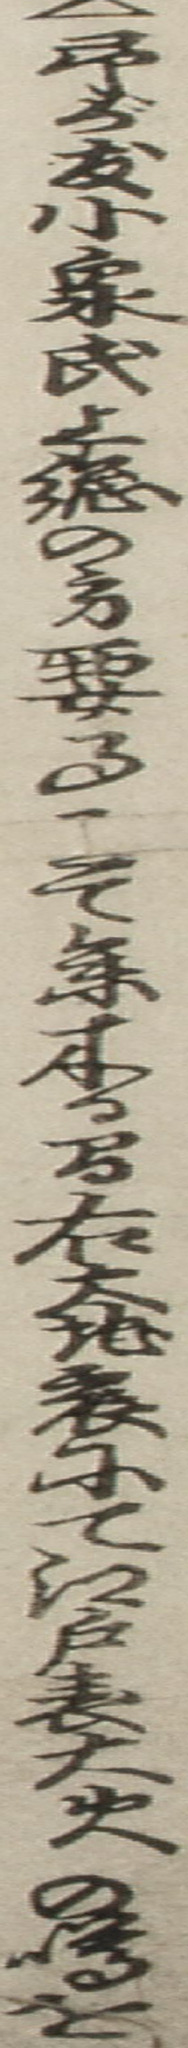△予が友小泉氏上総の方要事にて参来る間右大地震にて江戸表大火の噂を
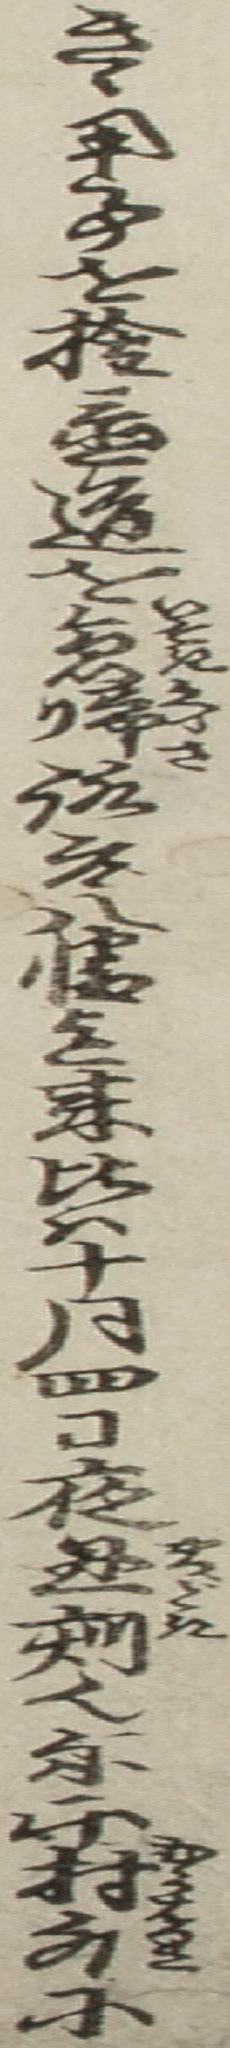きゝ用事を捨置道を急帰佐元八幡迄来比は十月四日夜丑刻也尓平村外に
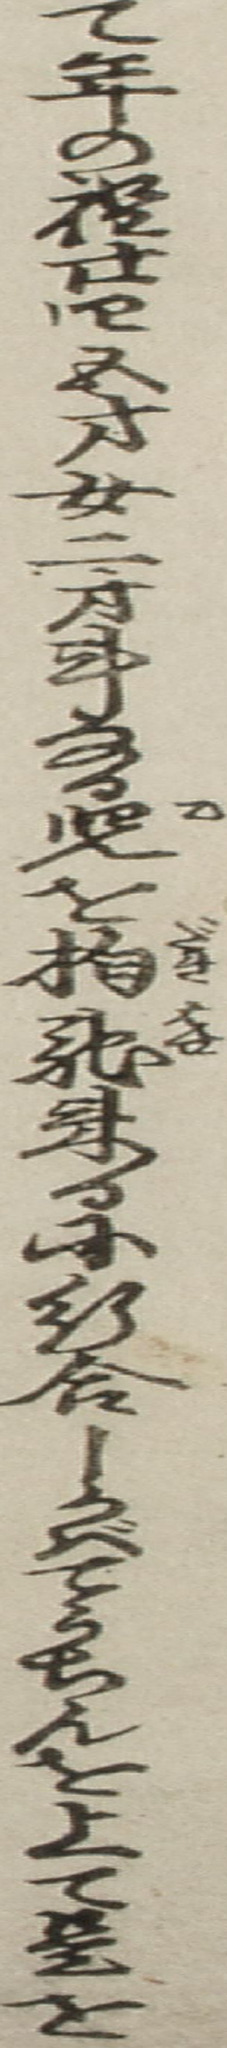て年の程廿四五才女ニ才計なる児を抱馳来るに行合しかばてうちんを上て是を
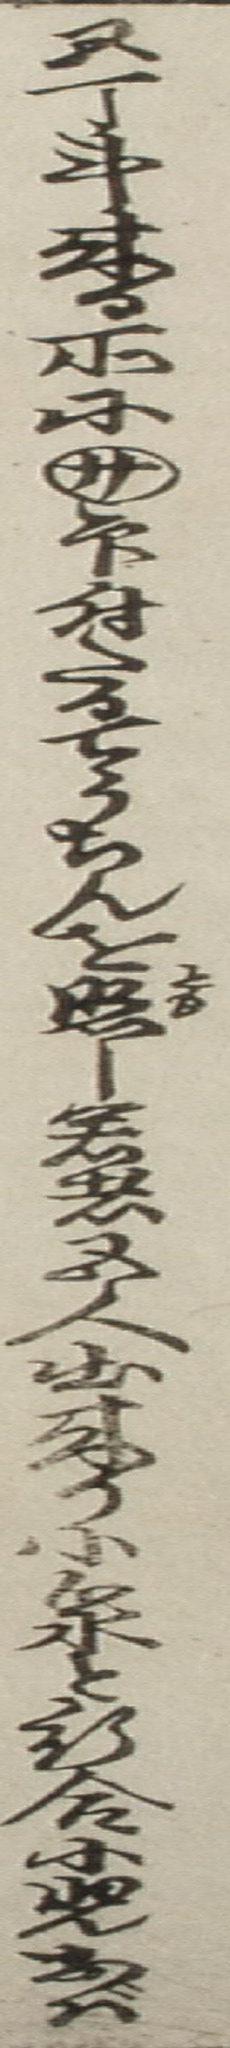五丁半来る所に印付たるてうちんを照し若者五人出来り小泉と行合小児おば
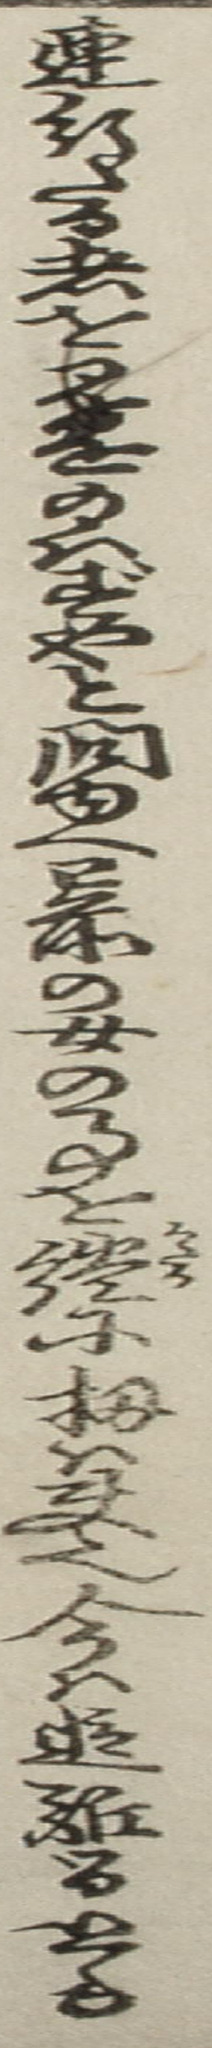連行たる者を見懸給はずやと問ゆへ已前の女の事を談かたるに扨は夫也今は追駈るとも
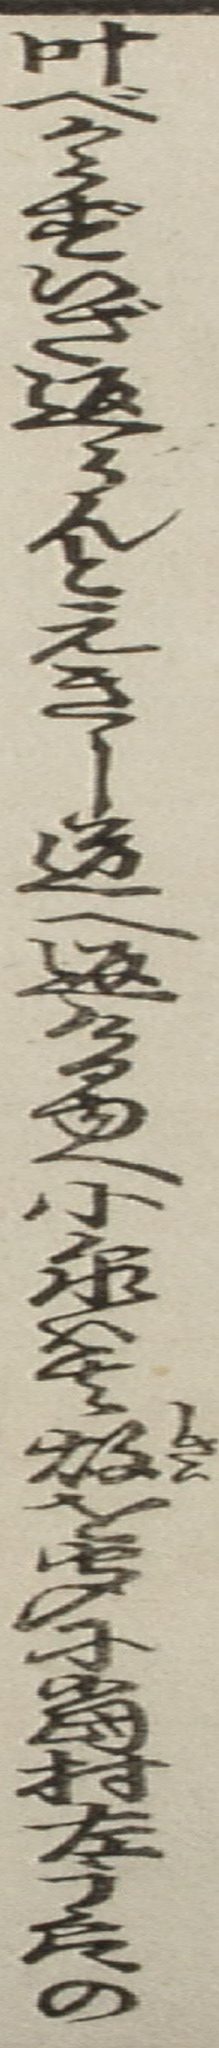叶べからずいざ返らんと元きし道へ返けるゆへ小泉は其故を聞に当村左う良の
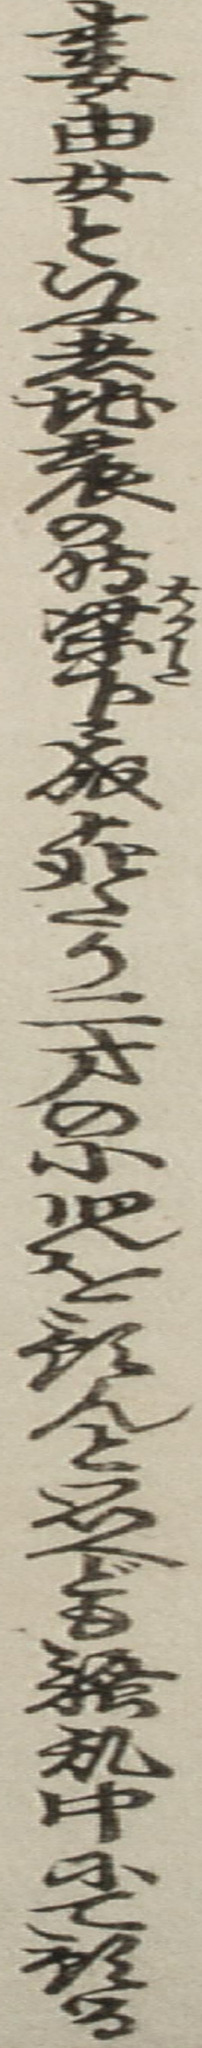妻由女といふ者地震の時梁下に成死たり二才の小児を預んと思へども騒乱中にて預る
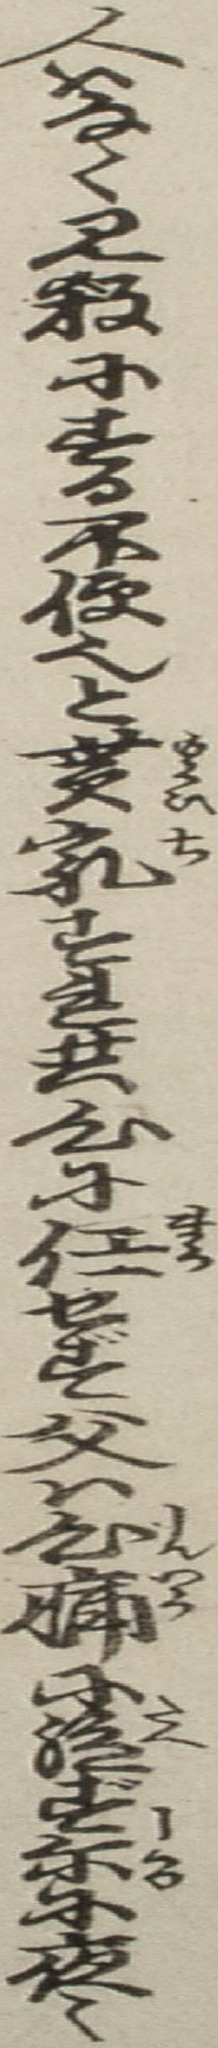人はなく見殺にする不便也と貰乳すれ共心に任せず父は心痛に絶ず尓しかるに夜々
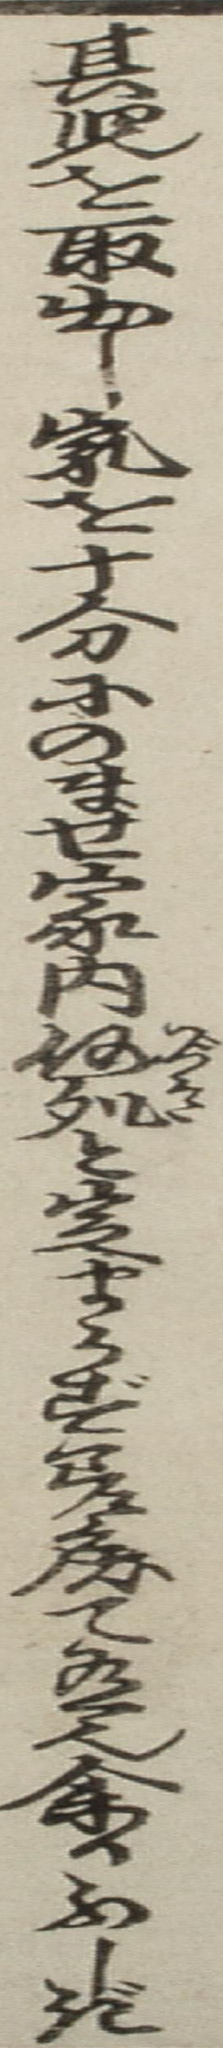其児を取出し乳を十分にのませ家内何処と定まらず差戻て有也余りふしぎ
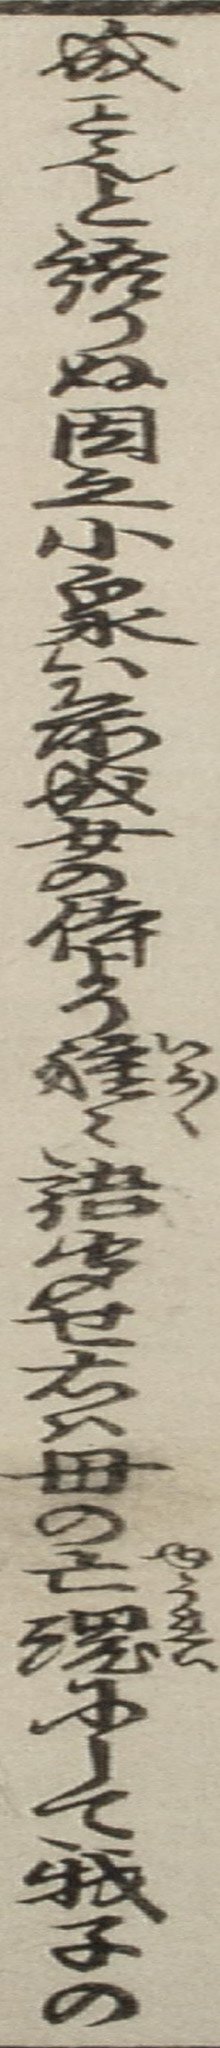成こと也と語りぬ固立小泉此前成女の侍より種々語聞せ右は母の亡魂にして我子の
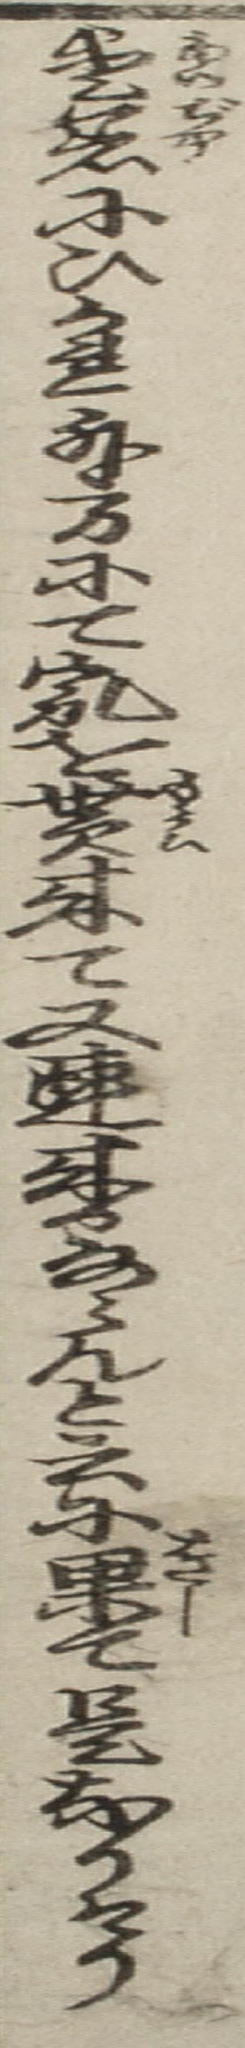愛着にひかれ外方にて乳を貰来て又連来るならんと云に果て是なりけり
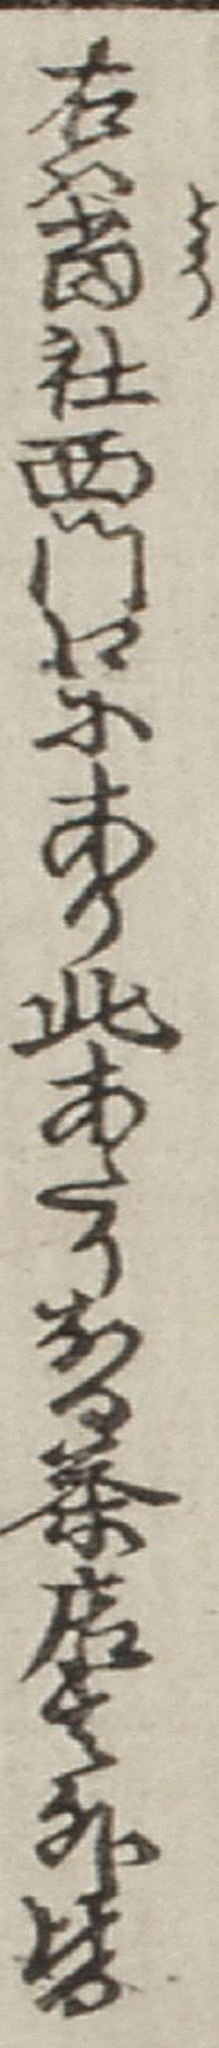右は当社西門口にあり此あたりなる茶店其外皆
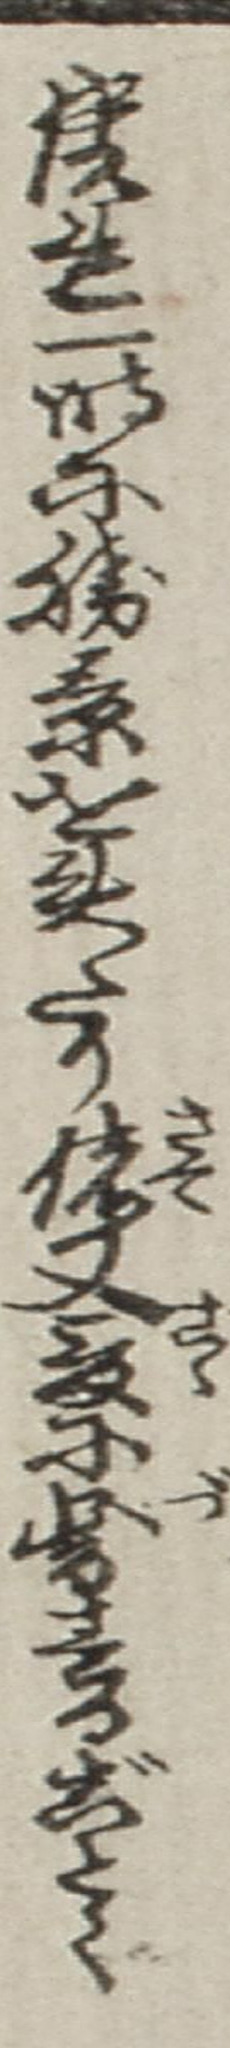潰れ一時に勝気を失たり偖又爰に図するごとく
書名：安政見聞誌　下
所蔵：東京大学地震研究所図書室 Earthquake Research Institute Library, The University of Tokyo, JAPAN
